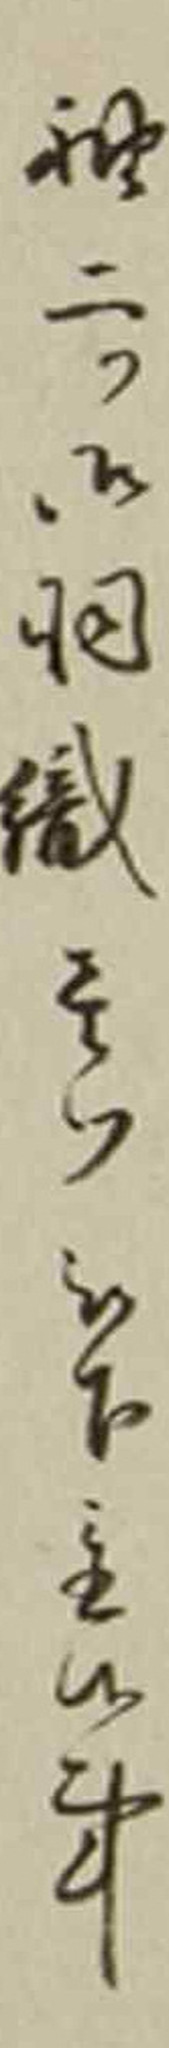袖二つ御羽織壱つ被下置候事
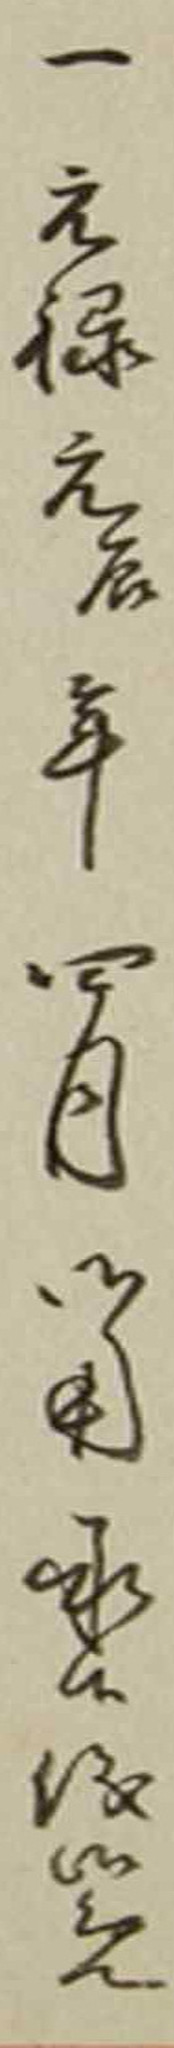一元禄元辰年四月御用承候儀御免
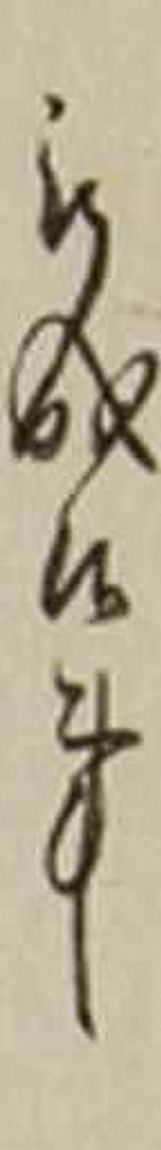被成候事
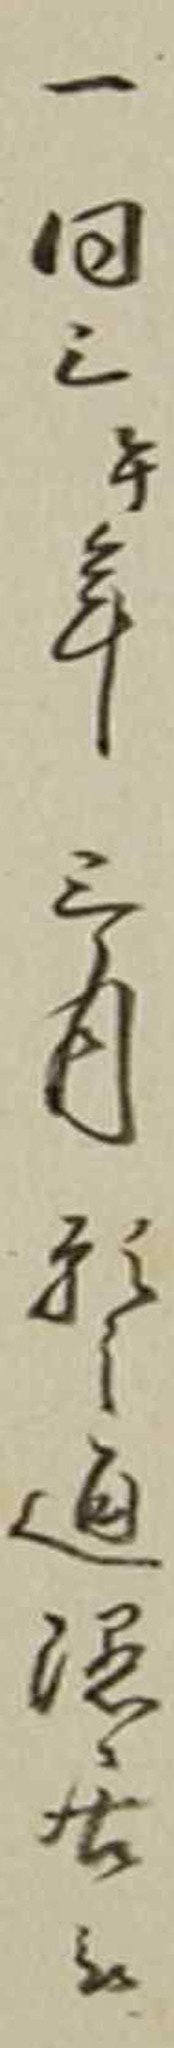一同三午年三月願之通隠居被
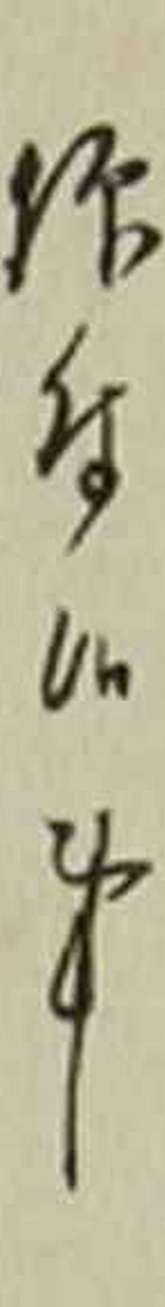仰付候事
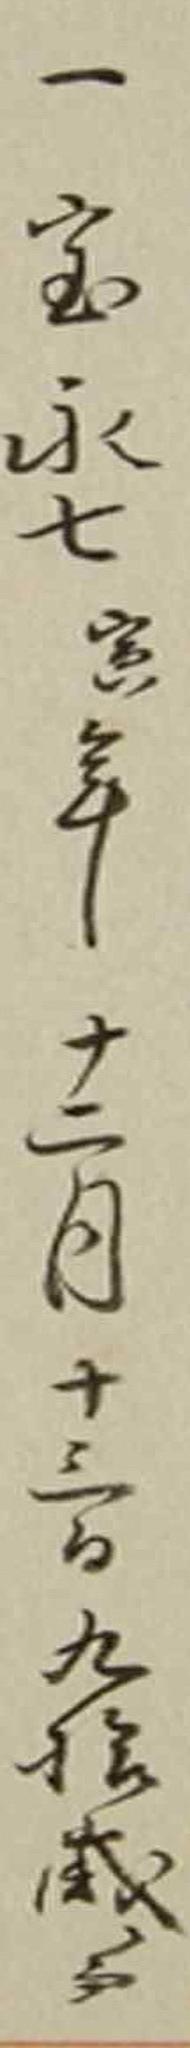一宝永七寅年十二月十三日九拾歳に而
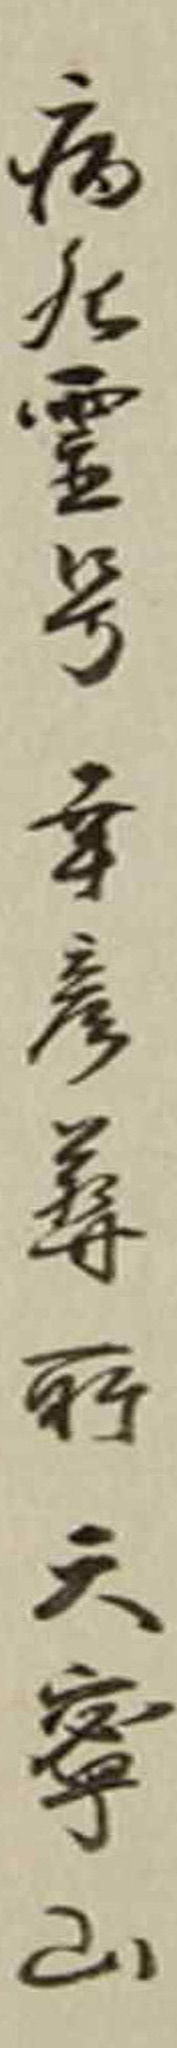病死霊号幸彦葬所天寧山
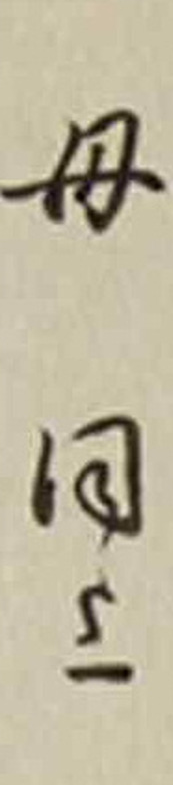母同上
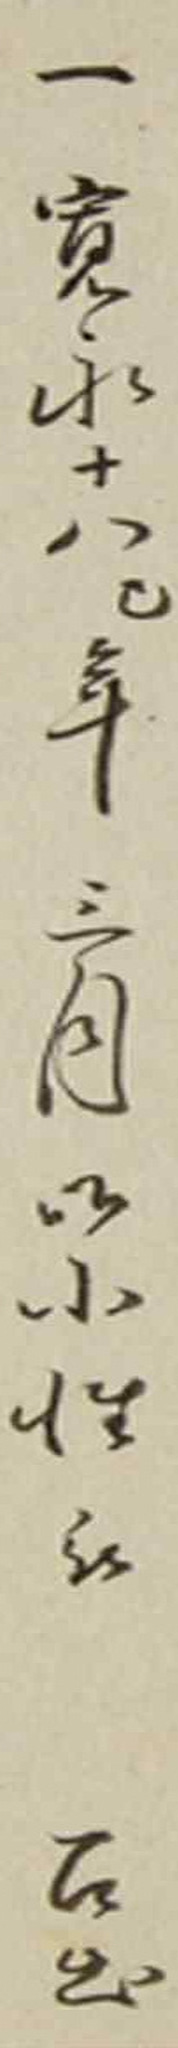一寛水十八巳年三月御小性被召出
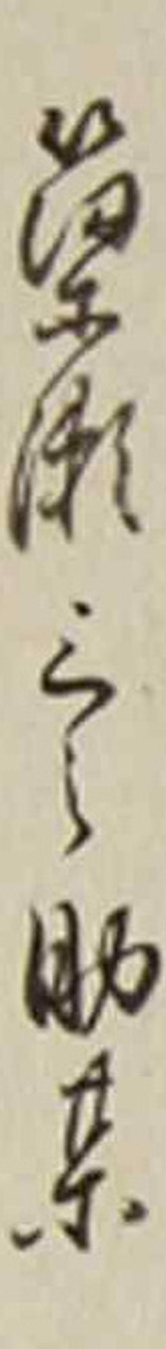簗瀬三之助某

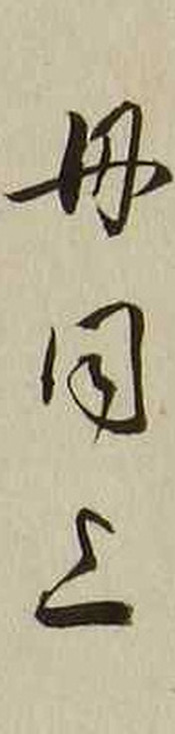母同上
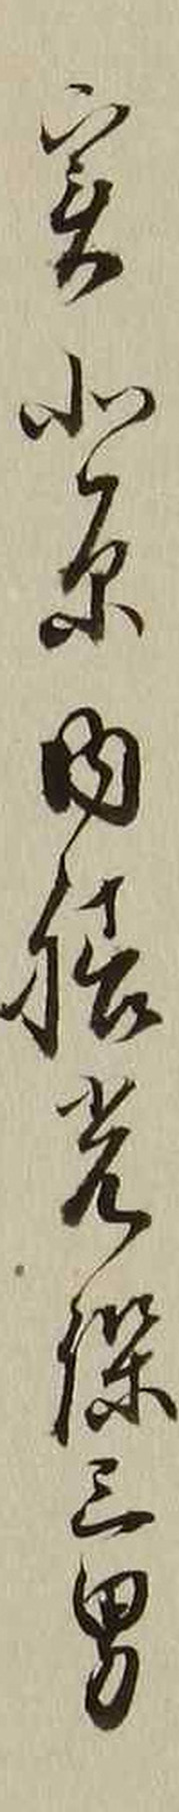実北原内膳光保三男
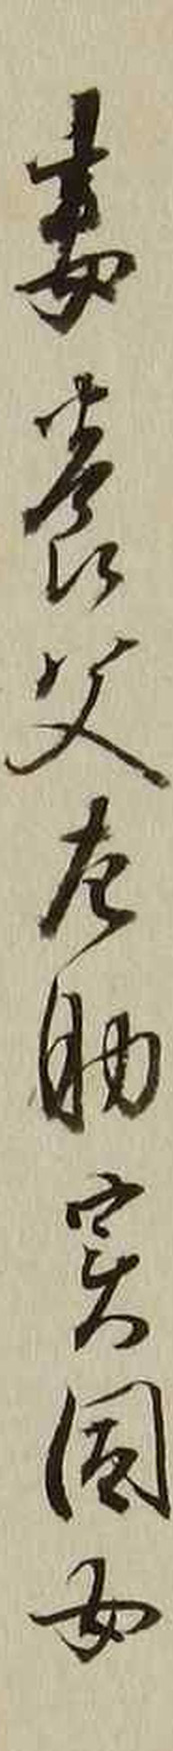妻養父左助実同女
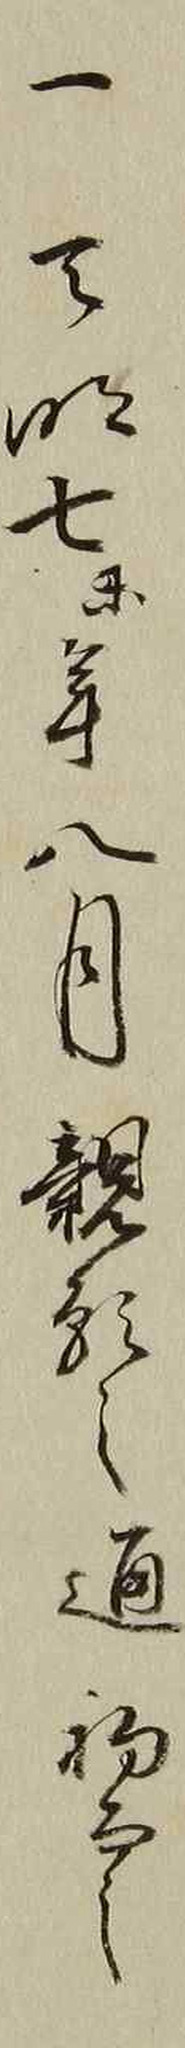一天明七未年八月親願之通初而之
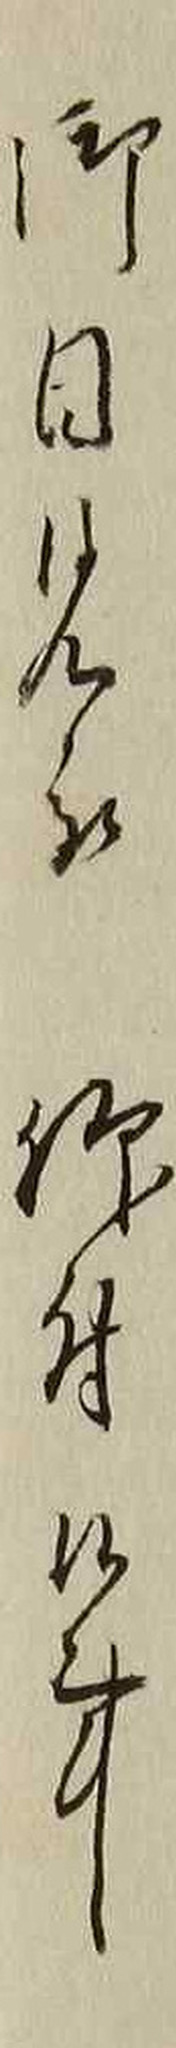御目見被仰付候事
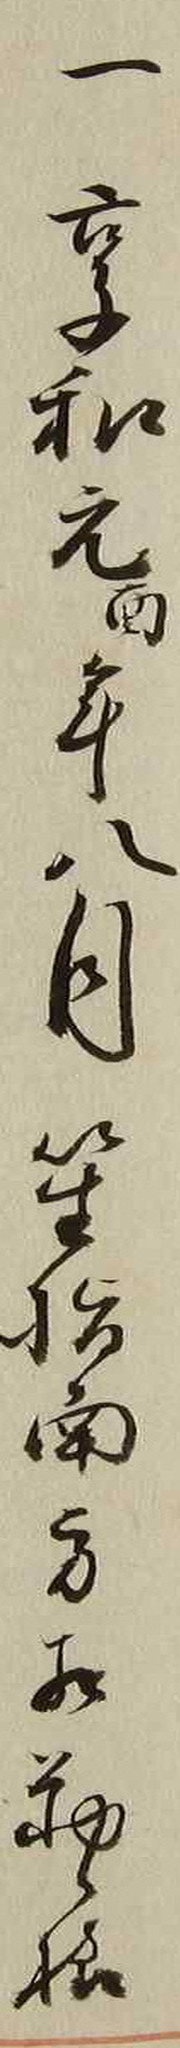一享和元酉年八月笙指南方相勤候様
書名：諸士系譜　巻之204　や之部1
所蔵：会津若松市立会津図書館
